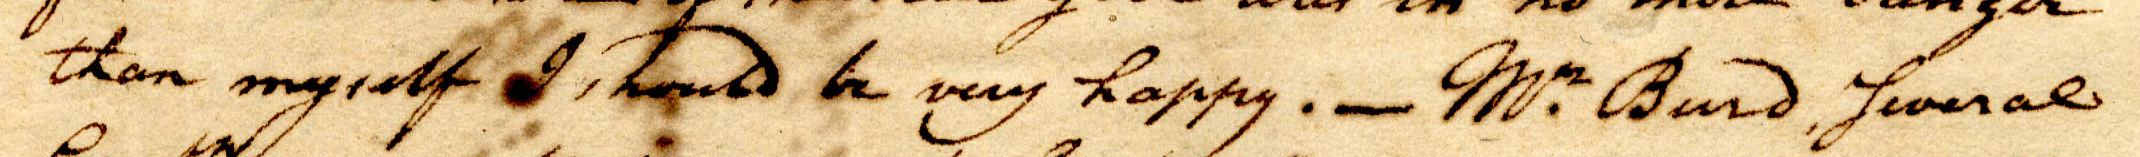than myself I should be very happy.- M^r. Bund, several
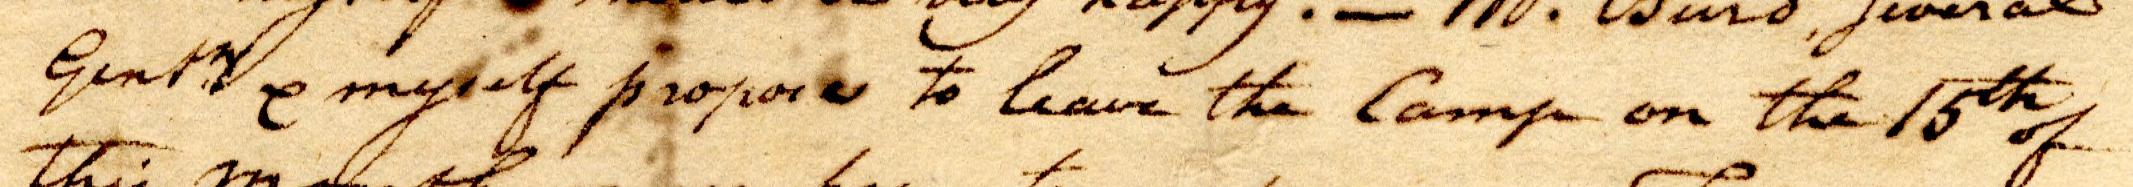Gent^m & myself propose to leave the Camp on the 15^th of
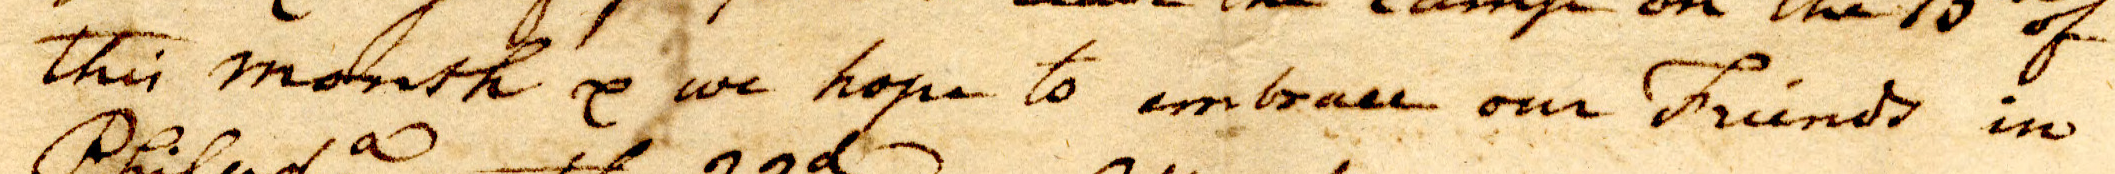this month & we hope to embrace our Friends in
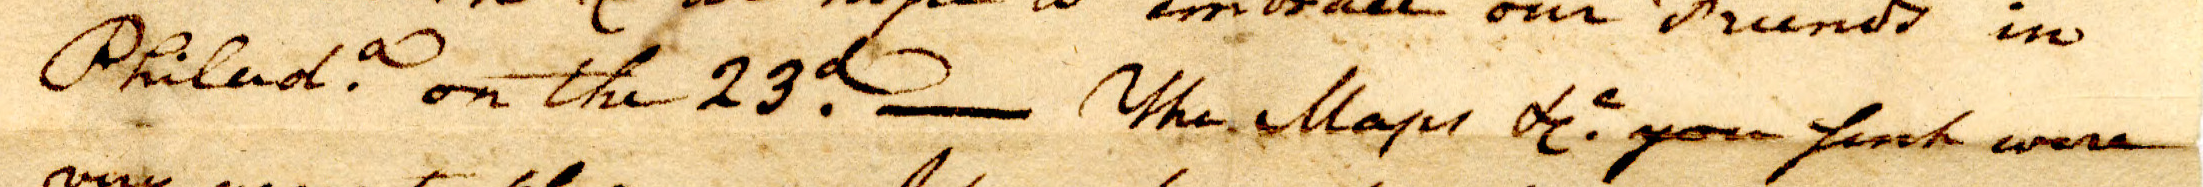Philad^a. on the 23^d.- The Maps &c^a. you sent were
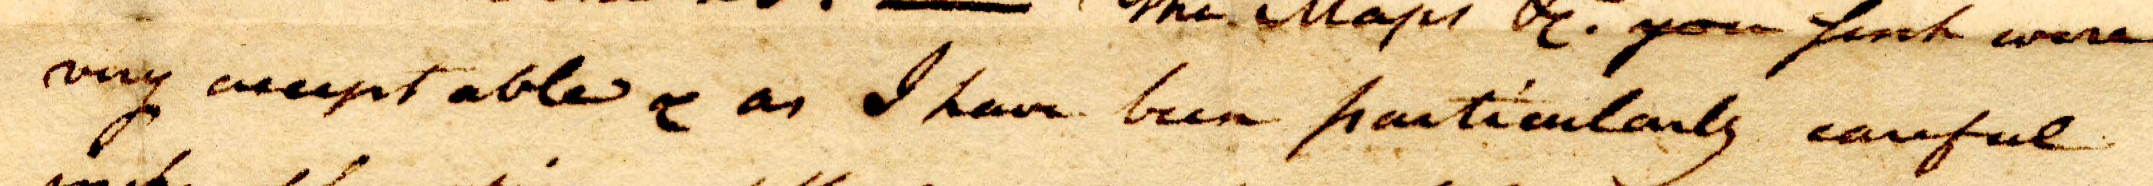very acceptable & as I have been particularly careful
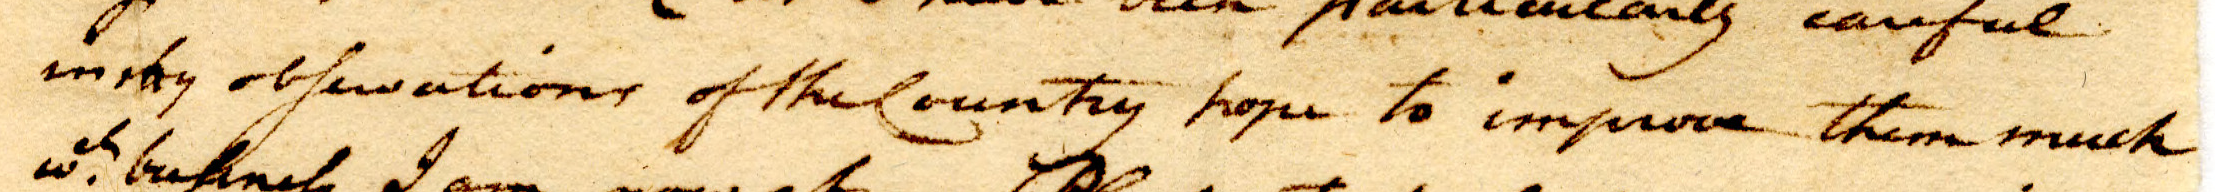in my observations of the Country hope to improve them much
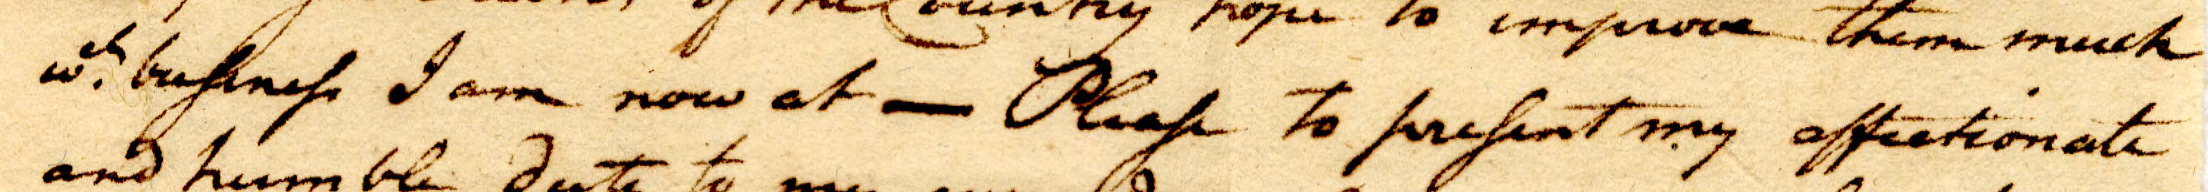w^ch. business I am now at- Please to present my affectionate
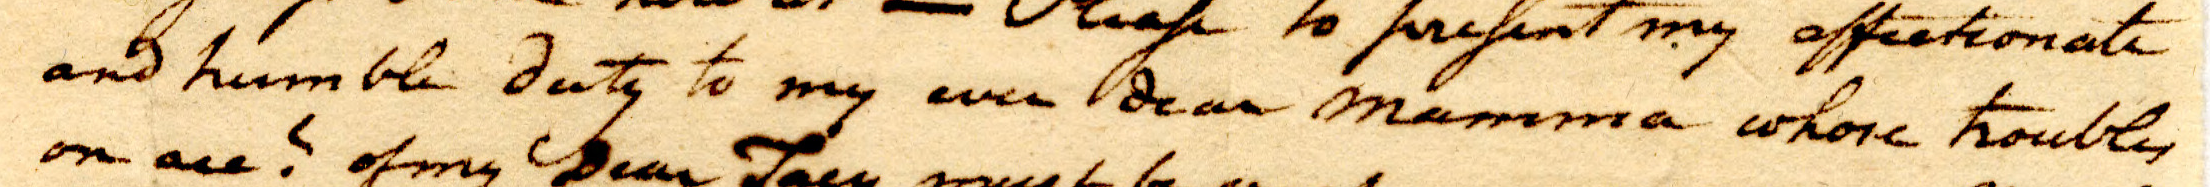and humble duty to my ever dear Mamma whose troubles
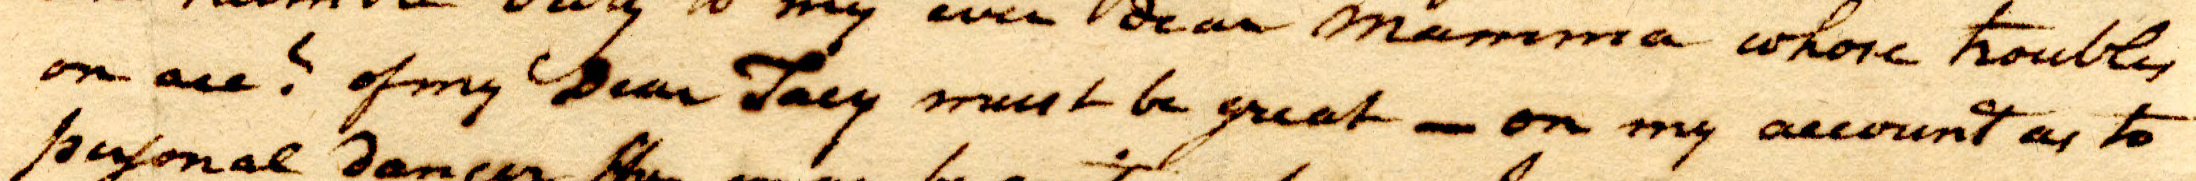on acc^t. of my Dear Jacy must be great- on my account as to
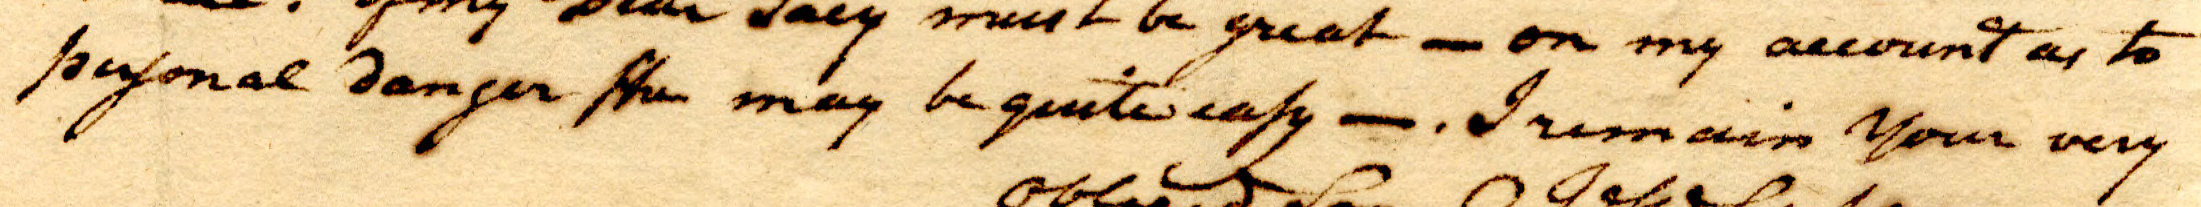personal danger she may be quite easy-. I remain your very
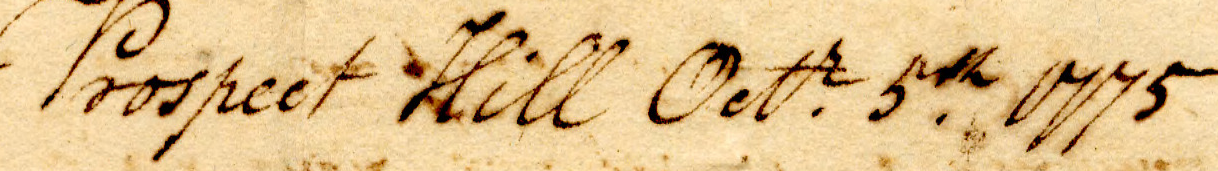Prospect Hill Oct^r. 5^th 1775
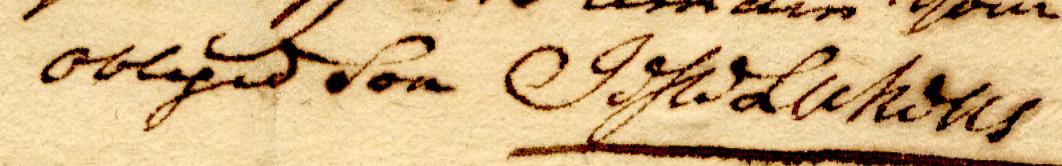obliged son Jesse Lukens
